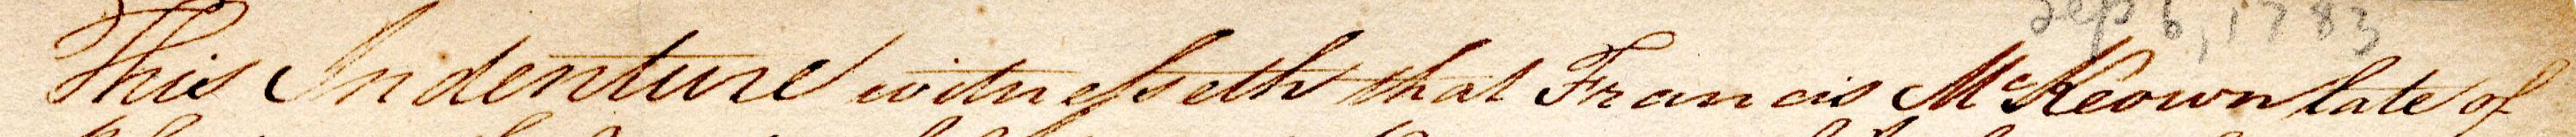This Indenture witnesseth that Francis M^cKeown late of
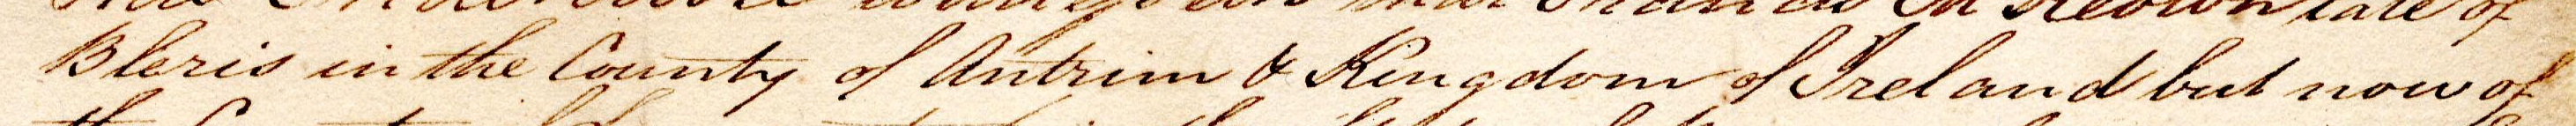Bleris in the County of Antrim & Kingdom of Ireland but now of
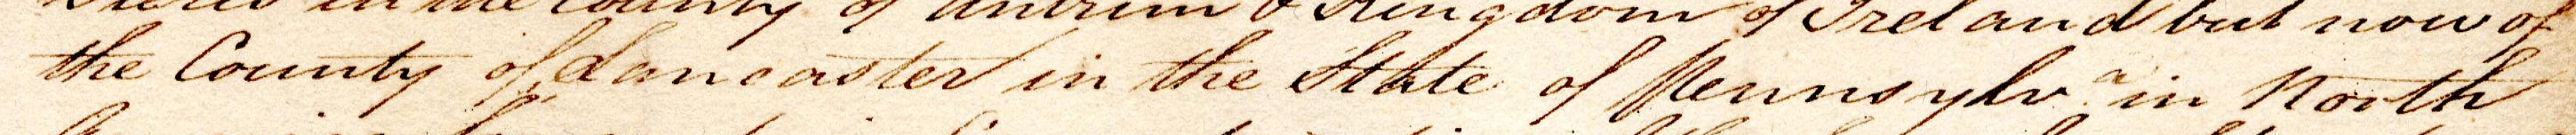the County of Lancaster in the State of Pennsylv^a in North
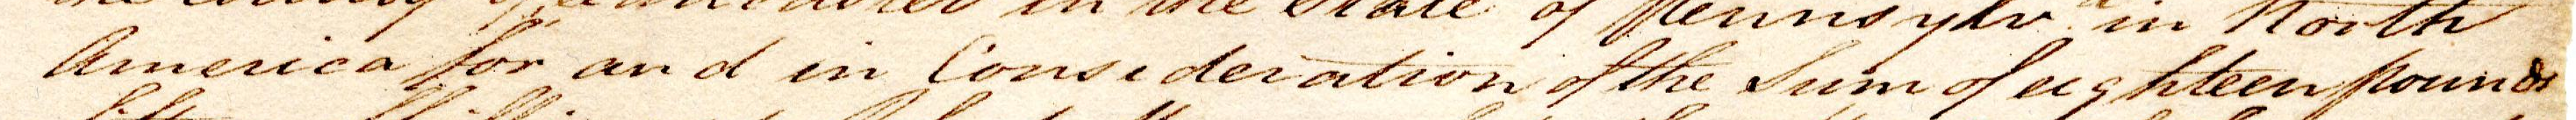America for and in Consideration of the Sum of eighteen Pounds
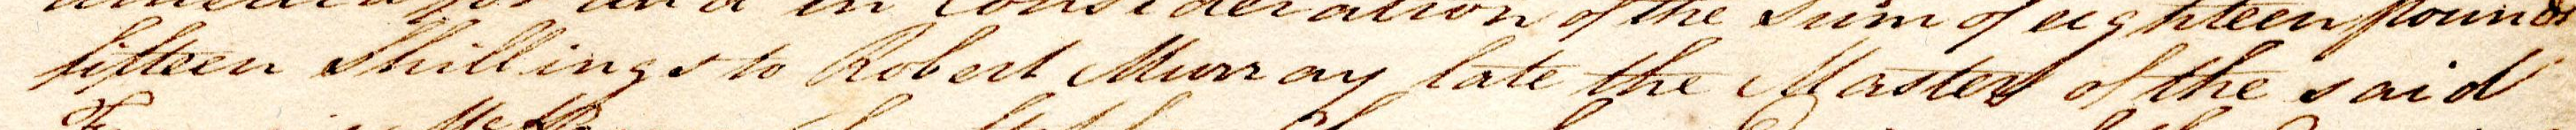fifteen Shillings to Robert Murray late the Master of the said
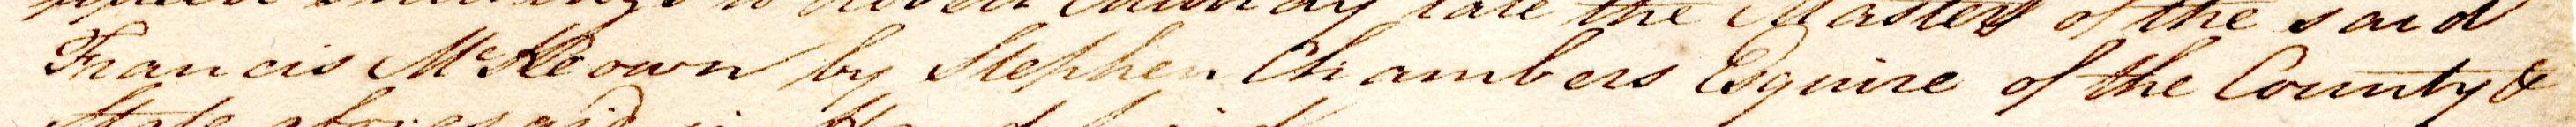Francis M^cKeown by Stephen Chambers Esquire of the County &
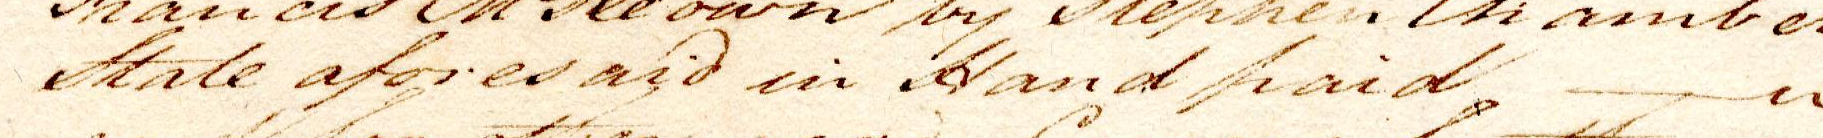stile aforesaid in Hand paid-
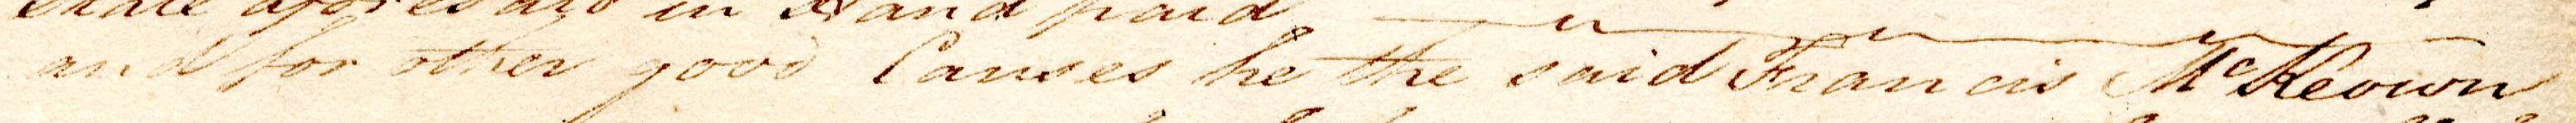and for other good Causes he the said Francis M^cKeown
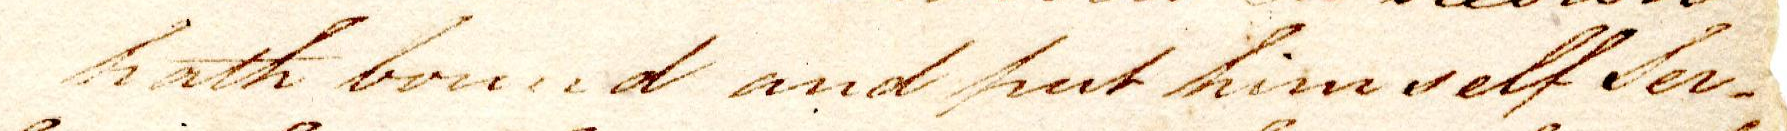hath bound and put himself Ser-
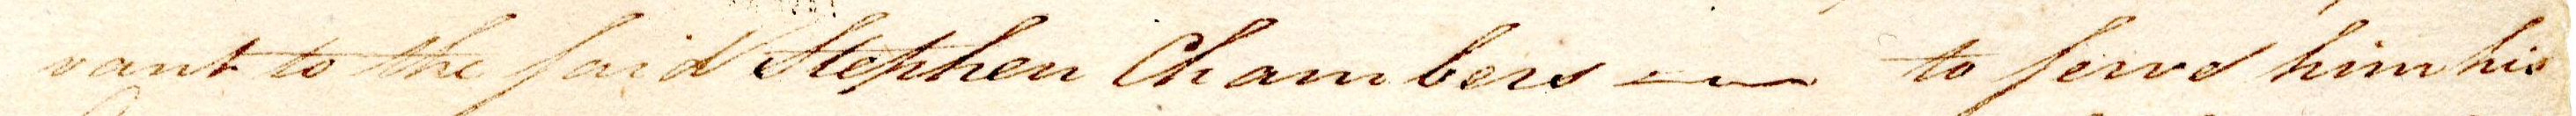-vant to the said Stephen Chambers- to serve him his
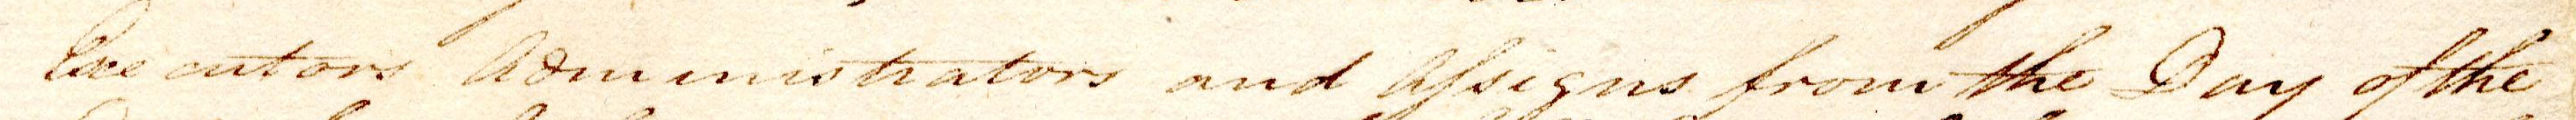Executors Administrators and assigns from the Day of the
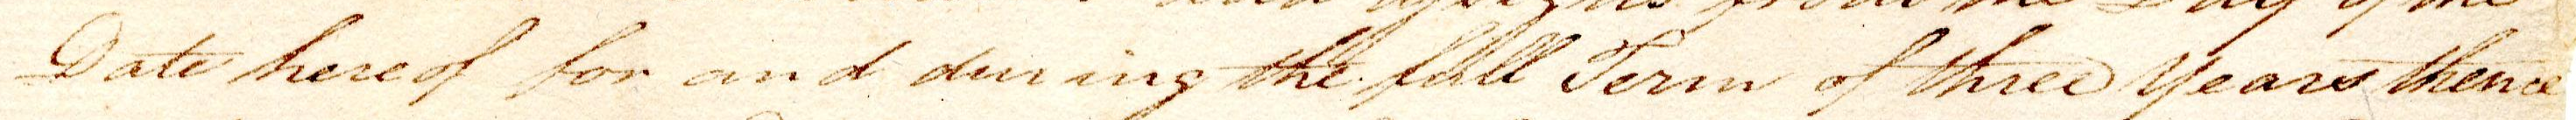Date hereof for and during the fall Term of three years thence
